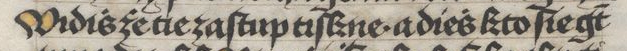Vidiš że tie zaſtup tiſkne.a dieṡ kto ſie ḡt
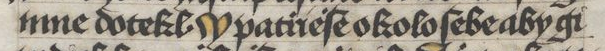mne dotekl.Y patṙíeẛe okolo ſebe aby gi
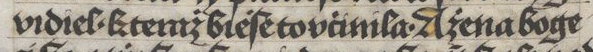vidiel.kteraż bieẛe ty vċinila.A żena boge¬
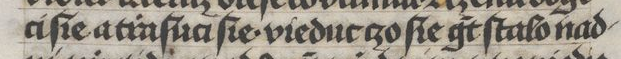ti ſie a tṙaſuci ſie.vieduc czo ſie ḡt ſtalo nad
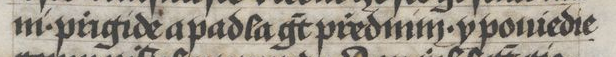ni.pṙigide a padla ḡt přednim.y pouiedie
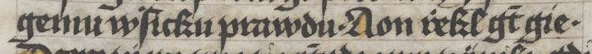gemu wẛicku prawdu. A on ṙekl ḡt gíe.
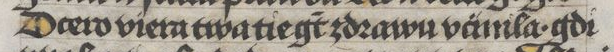Dcero viera twa tie ḡt zdrawu vċinila.gdi
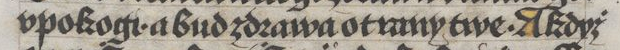vpokogi.a bud zdrawa ot rany twe.A kdyż
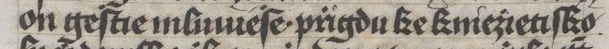ot geẛtie mluuíeẛe.pṙigdu ke knieżieti ſko¬
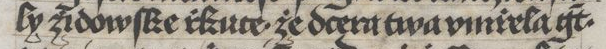ly żidowſké ṙkuce.że dcera twa umṙela ḡt
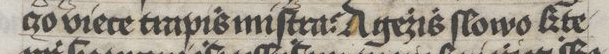co víece trapíṡ miſtra?A geżíṡ ſlowo kte¬
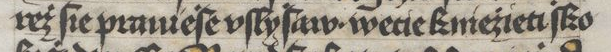réż ſie prawíeẛe vſlyẛaw.wecie knieżieti ẛko¬
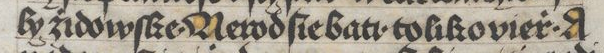ly żidowſké.Nerod ſie bati.toliko vieṙ.A¬
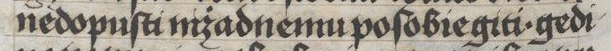nedopuſti niżadnemu poſobie giti.gedi
